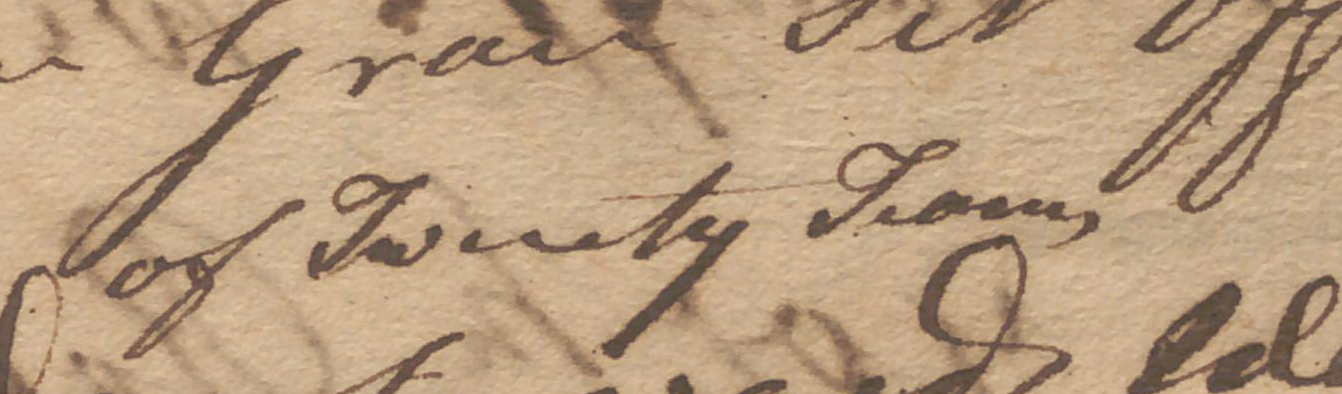of Tverety Teams
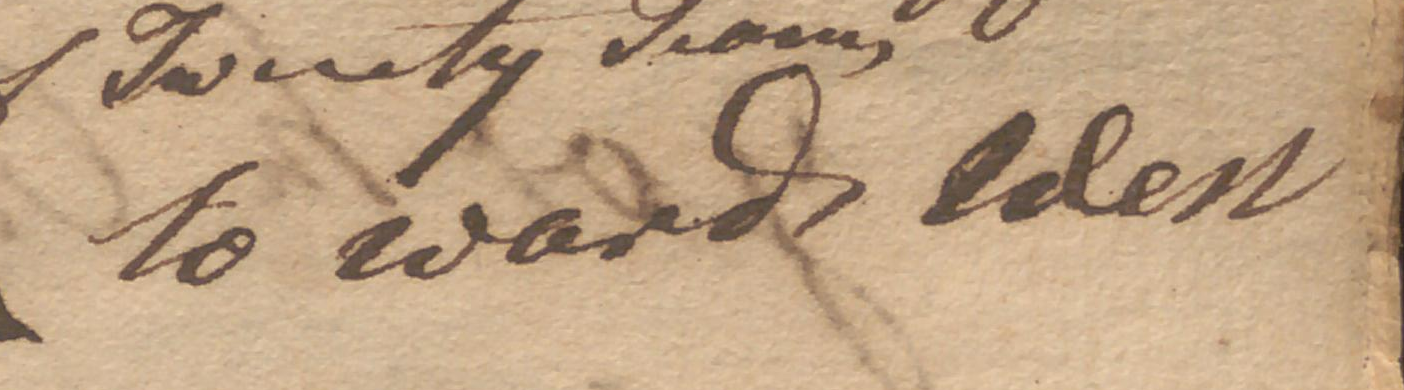to wards West
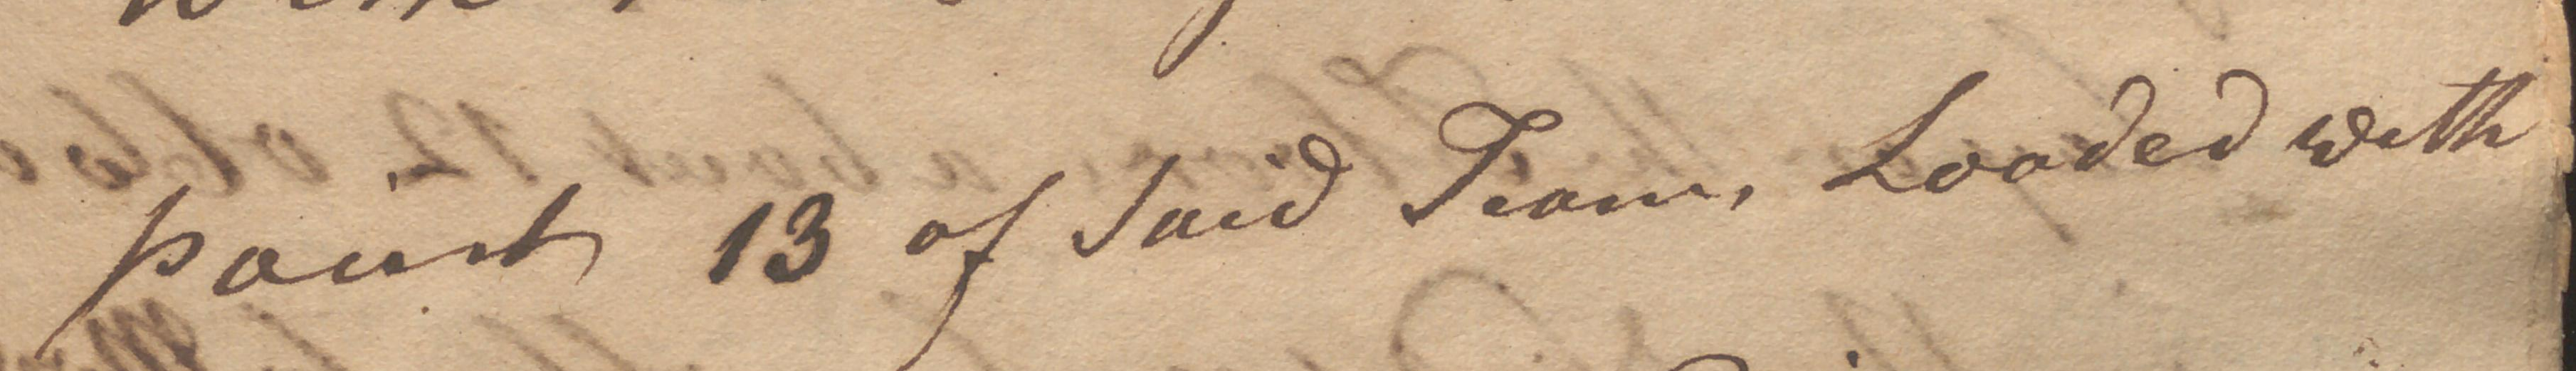point 13 of Said Teams Loaded with
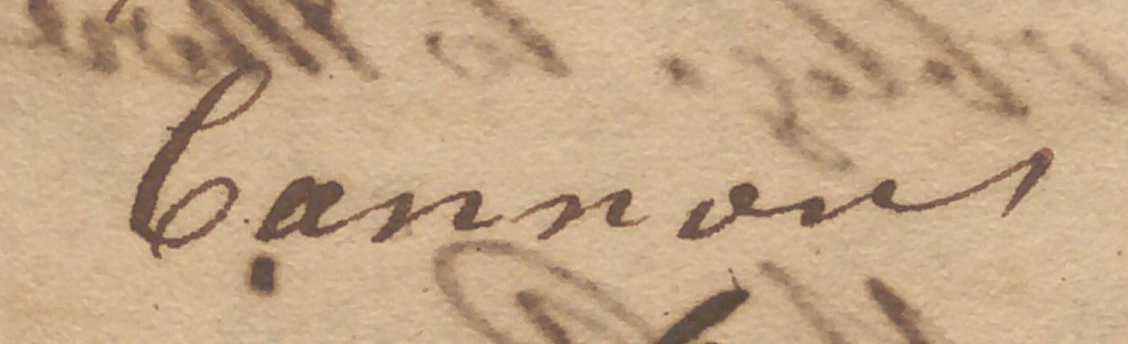Cannons
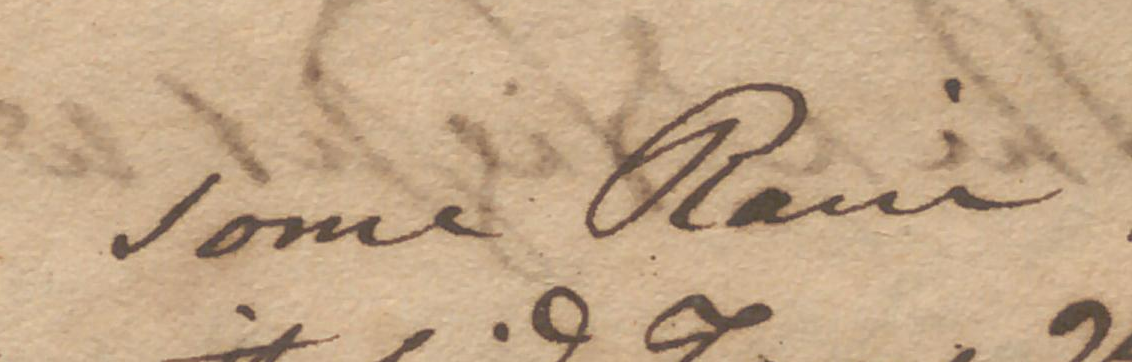some Rain
